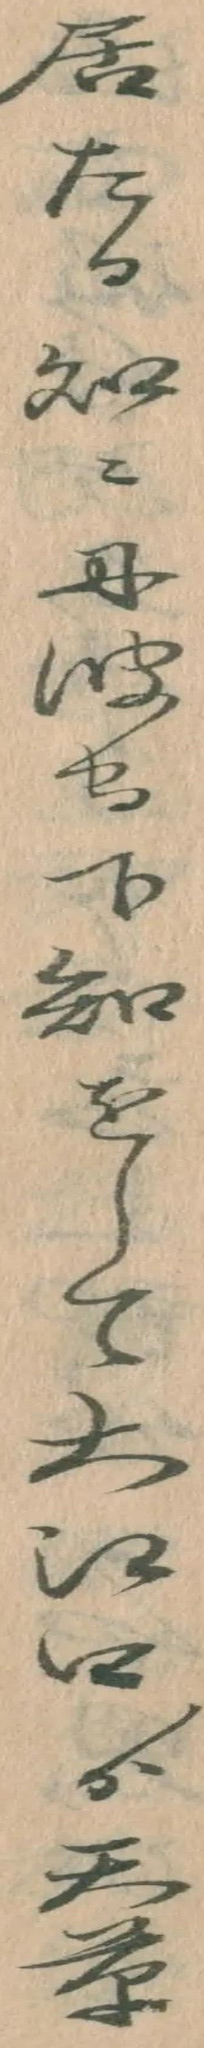居たる処に丹波守下知をして大江口ゟ天草
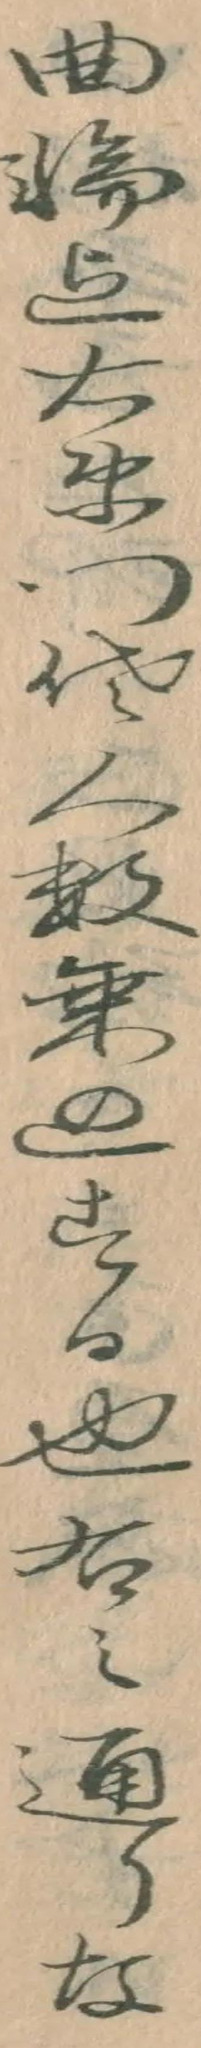曲輪迄右衛門佐人数乗込春る也右之通りな
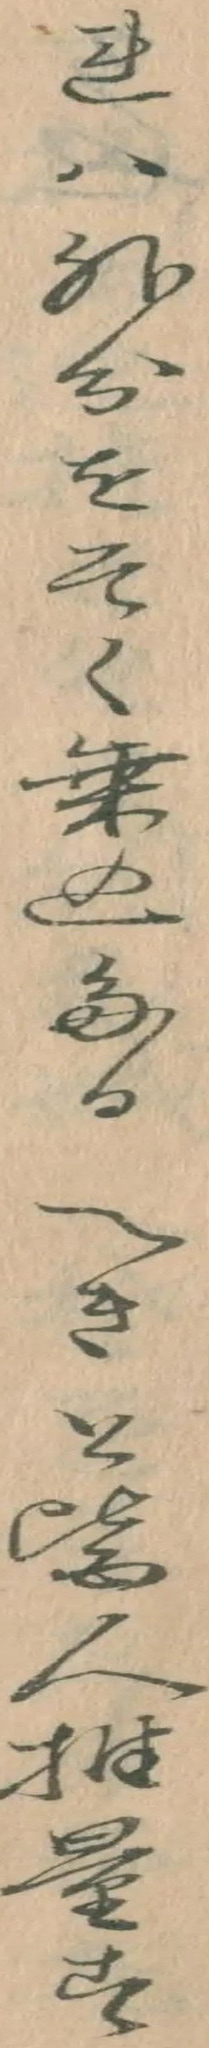連は外分をそく乗込多るへきと皆人推量春

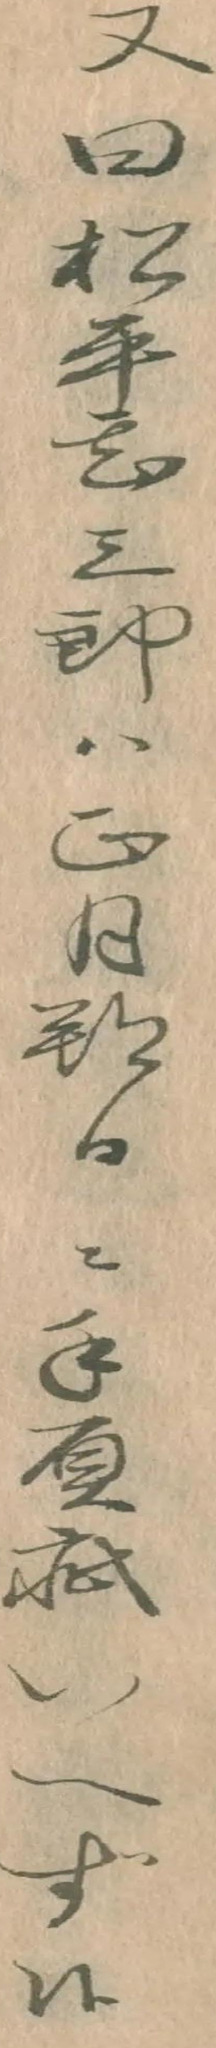又曰松平甚三郎は正月朔日に手負疵いへず候
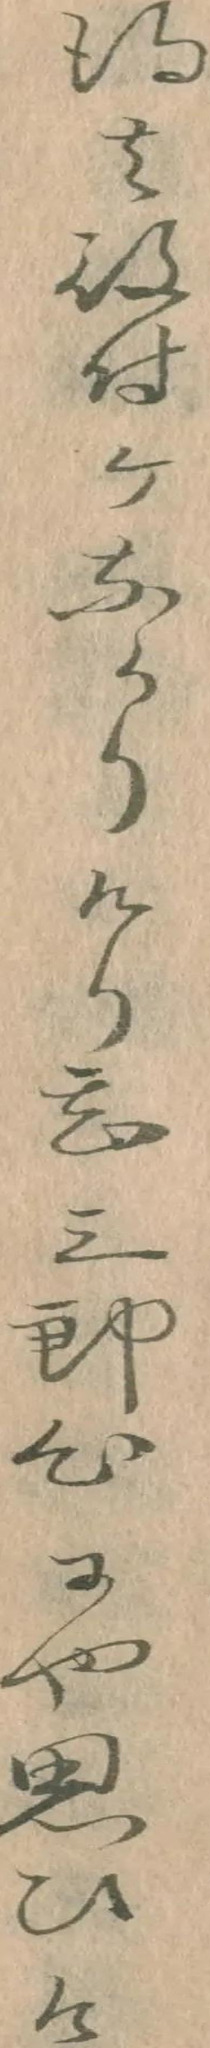得者役付けなかりけり甚三郎心尓や思ひけ
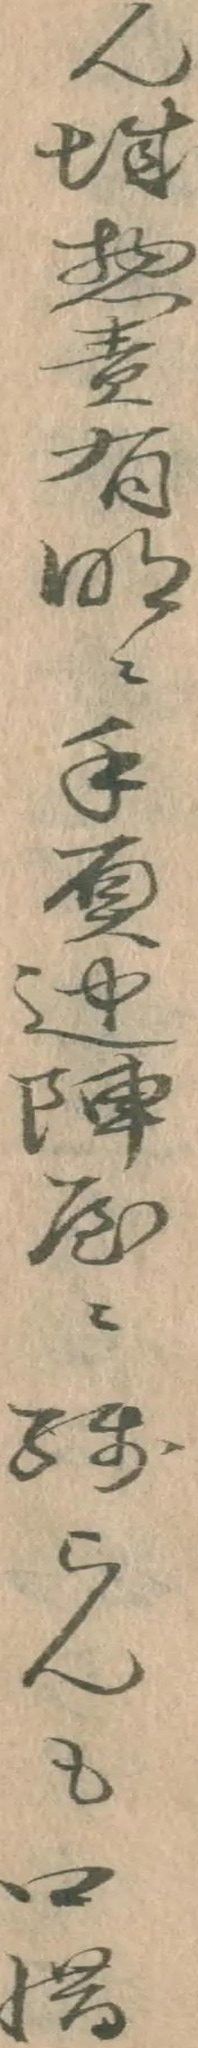ん城惣責有明に手負迚陣屋に残らんも口惜
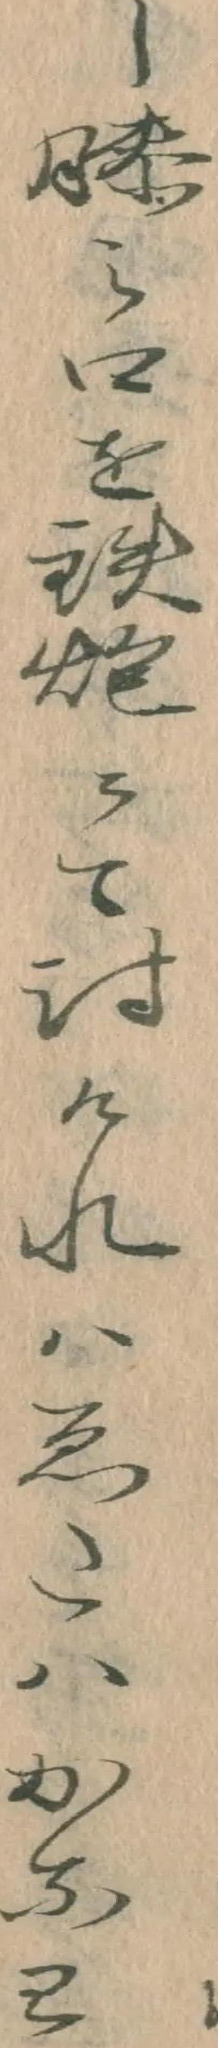し膝之口を鉄砲にて討けれはゑたはかな已
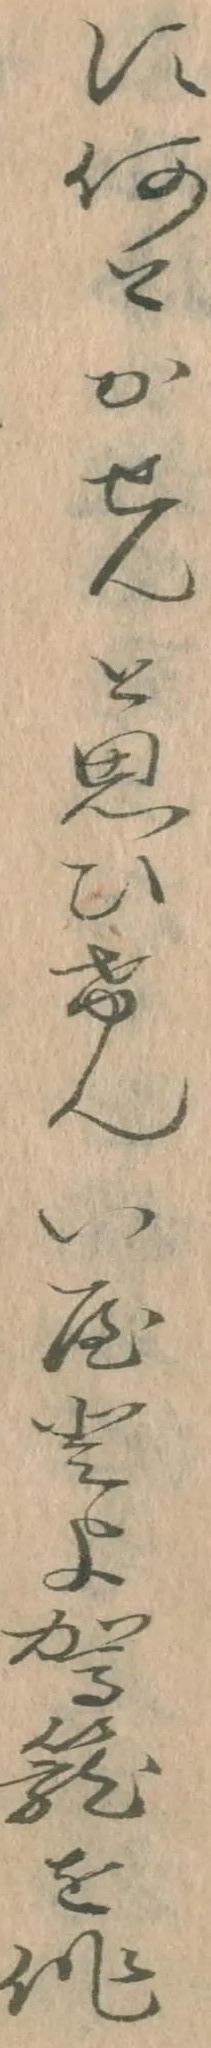須何とかせんと思ひ希んい屋登よ駕籠を作
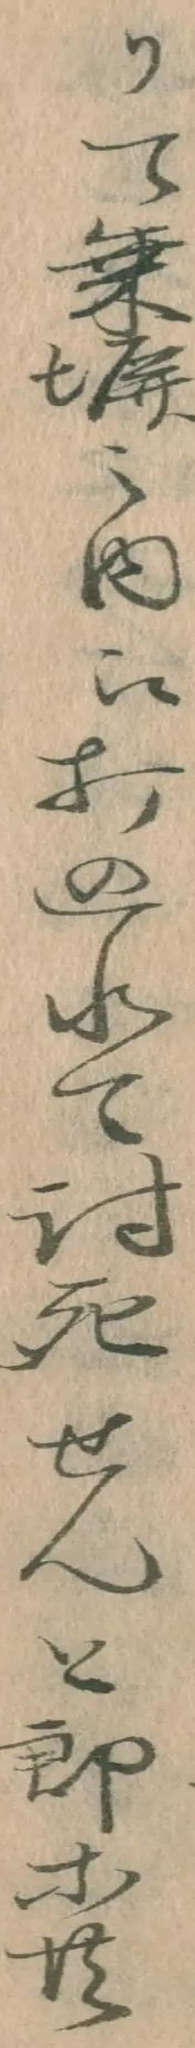りて乗塀之内江打込れて討死せんと郎等共
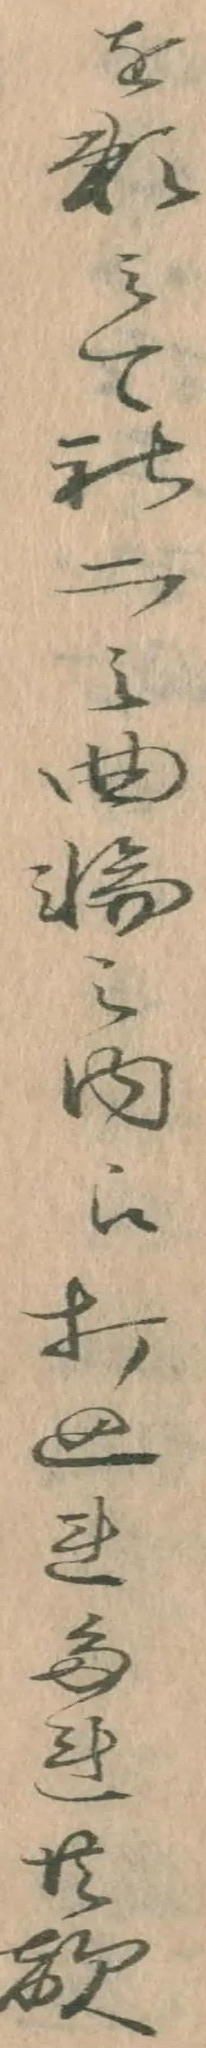を頼みて社二之曲輪之内江打込連多連共敵
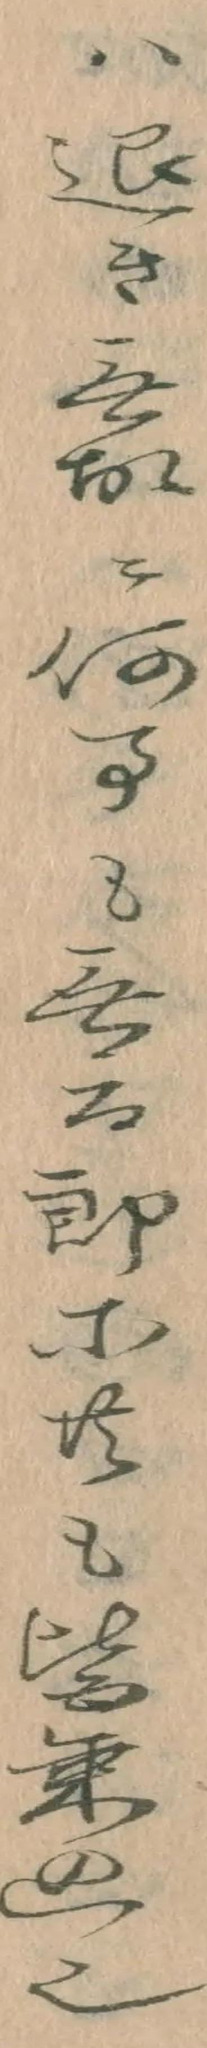は退き無故に何事も無而郎等共も皆乗込也
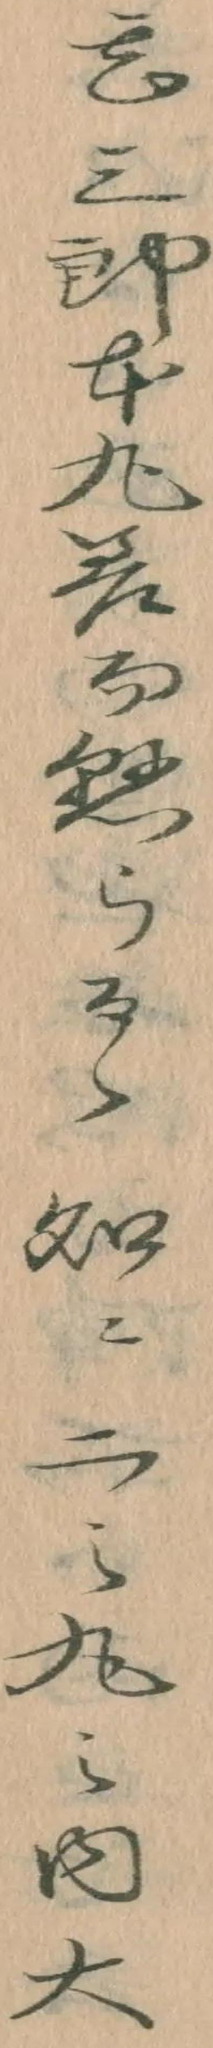甚三郎本丸差而懸らるゝ処に二之丸之内大
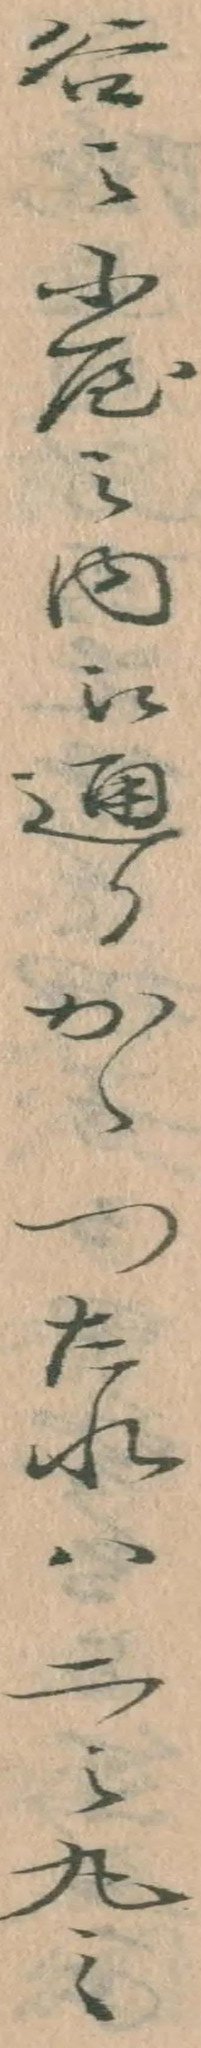谷之小屋之内江通りかゝつたれは二之丸之
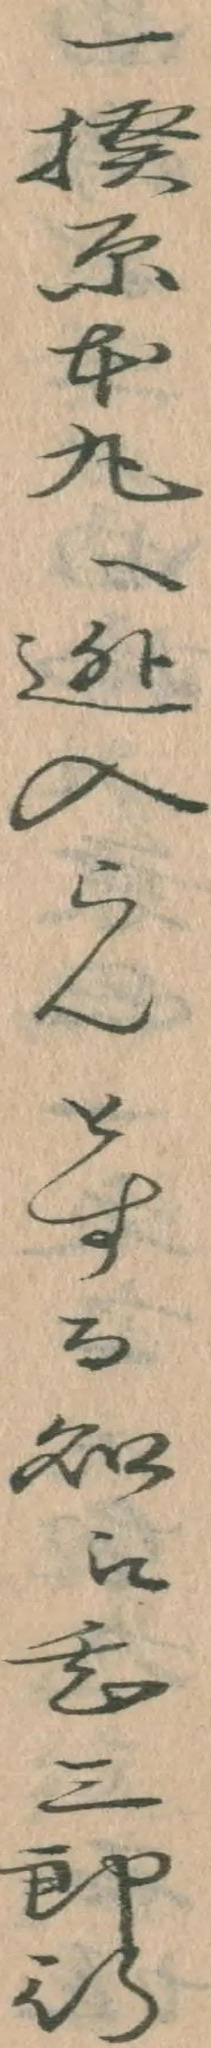一揆原本丸へ逃入らんとする処江甚三郎行
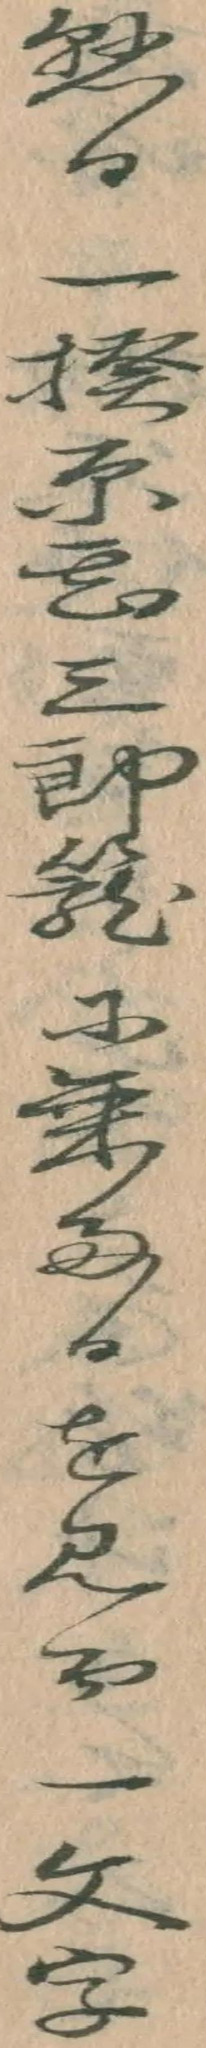懸る一揆原甚三郎籠尓乗多るを見而一文字
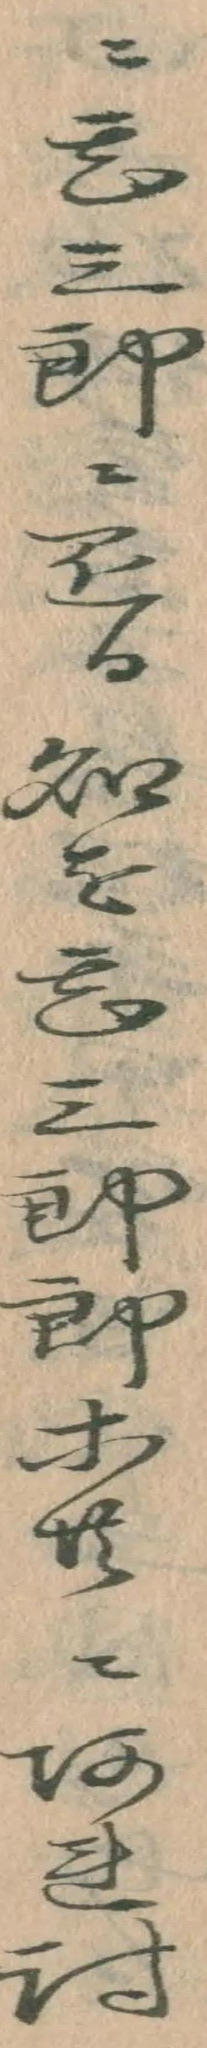に甚三郎に懸る処を甚三郎郎等共に阿連討
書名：切支丹御退治記 49巻. [8]
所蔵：国立国会図書館 National Diet Library, JAPAN
